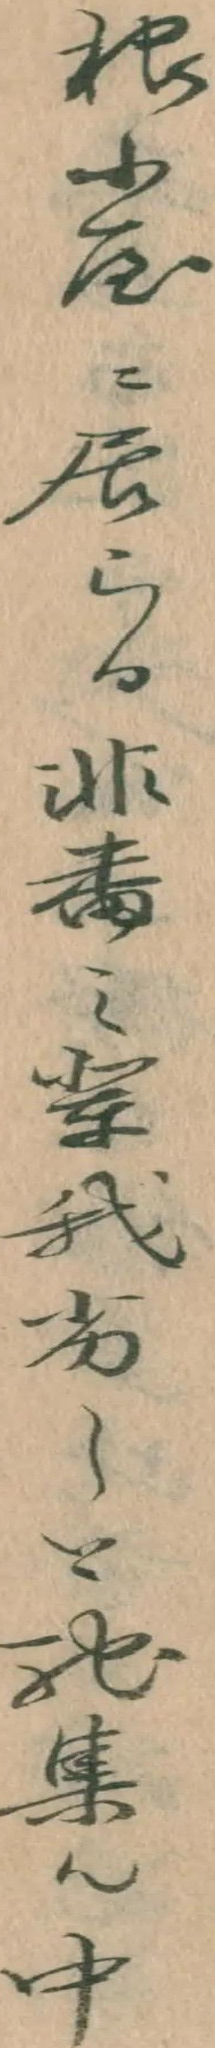根小屋に居らる非番之輩我劣しと馳集る中
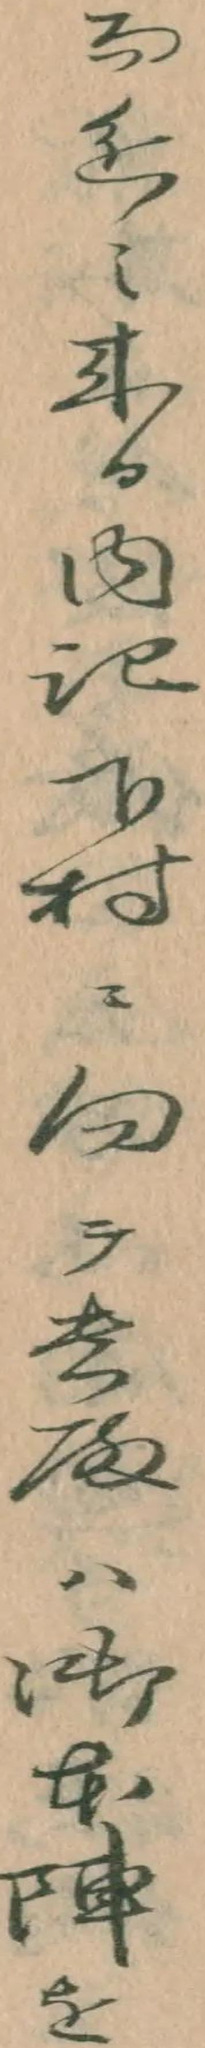而進之来る内記下村に向て貴殿は御本陣を
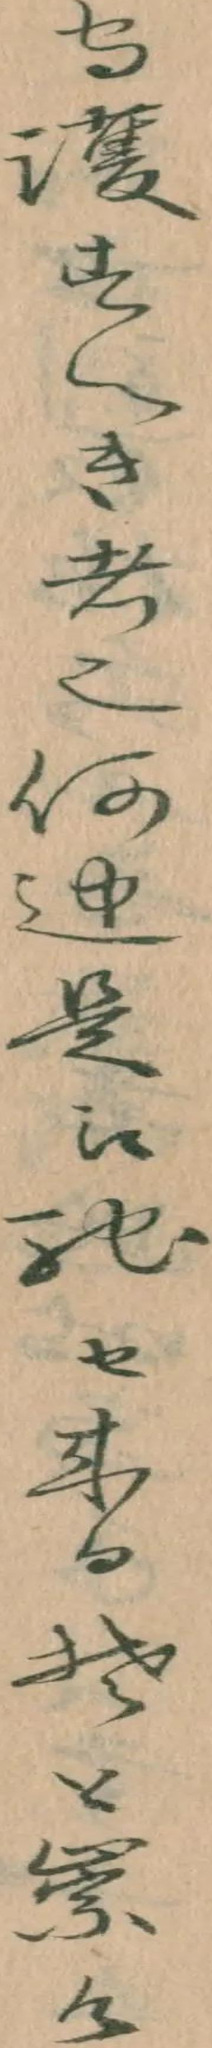守護春へき者也何迚是江馳せ来る楚と崇候
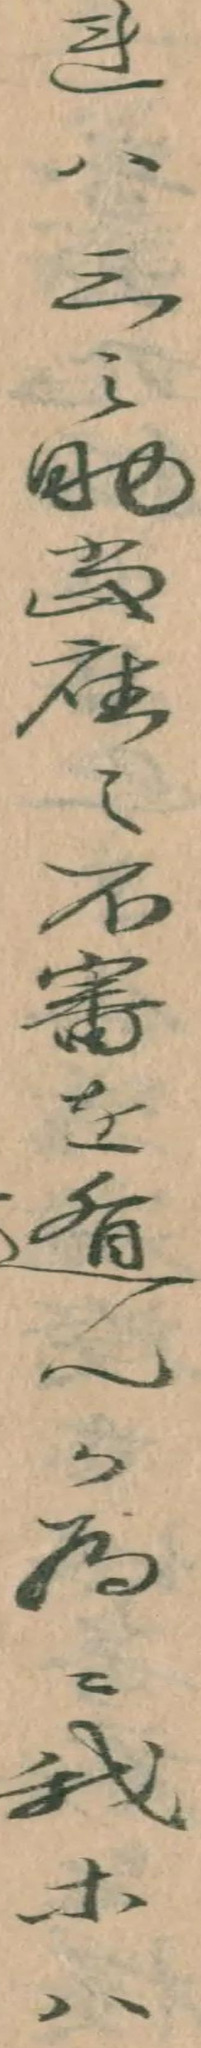連は三之助当座之不審を遁んか為に我等は
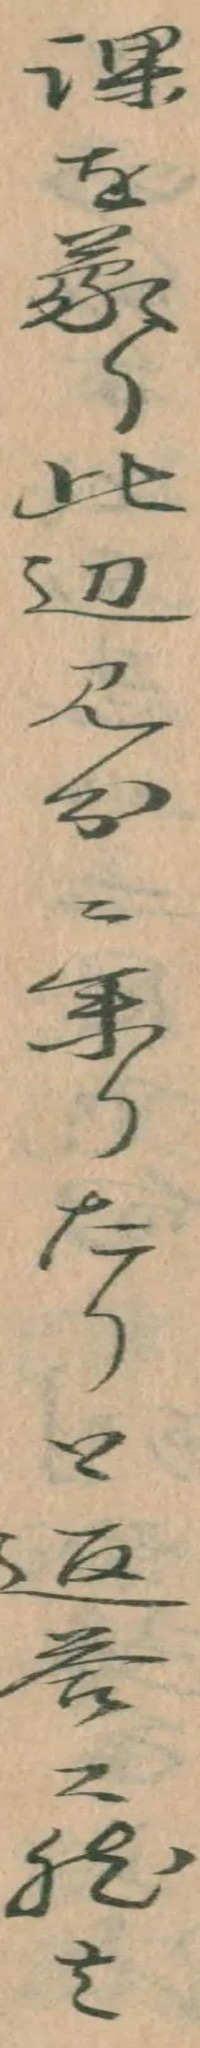課を蒙り此辺見分に参りたりと返答す然者
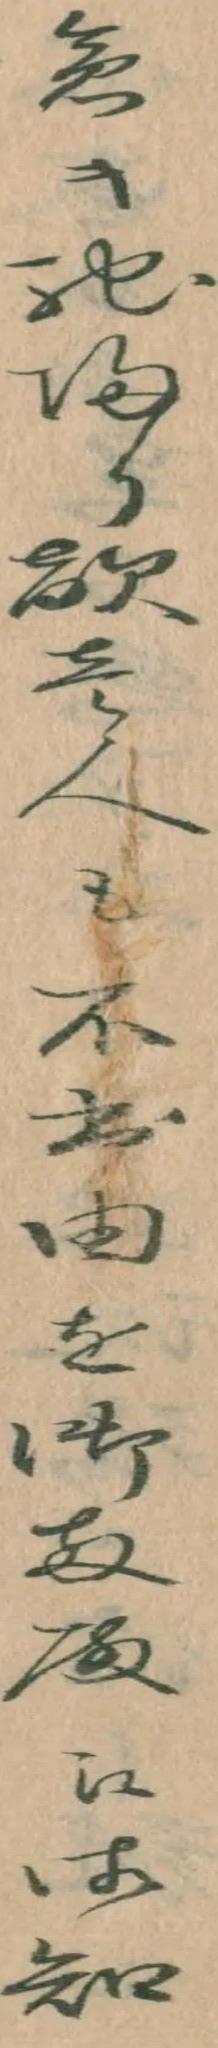急き馳帰り敵壱人も不出由を御両殿江御知
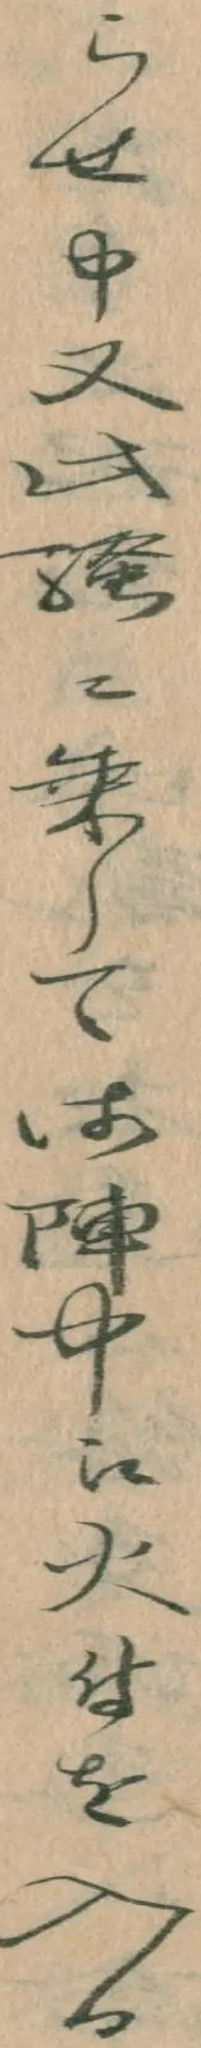らせ申又此騒に乗して御陣中江火付を入る
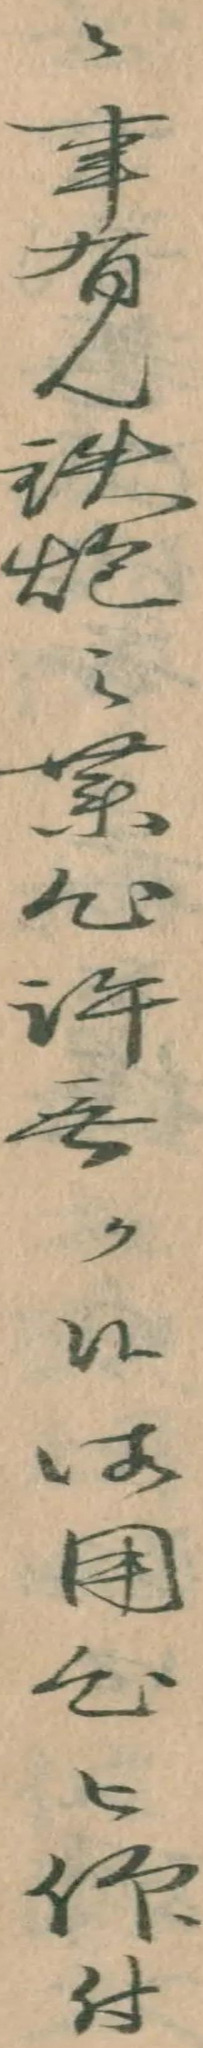か事有ん鉄炮之薬心許無く候御用心被仰付
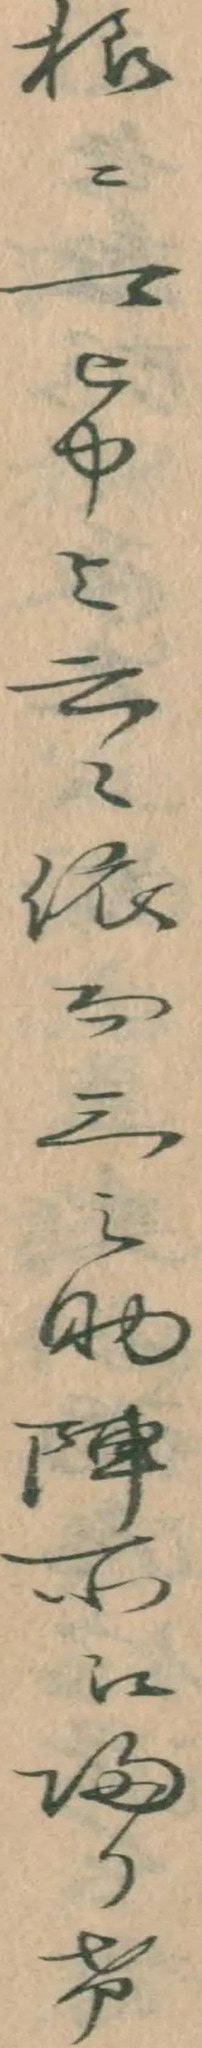様に可被申与云々依而三之助陣所江帰り希
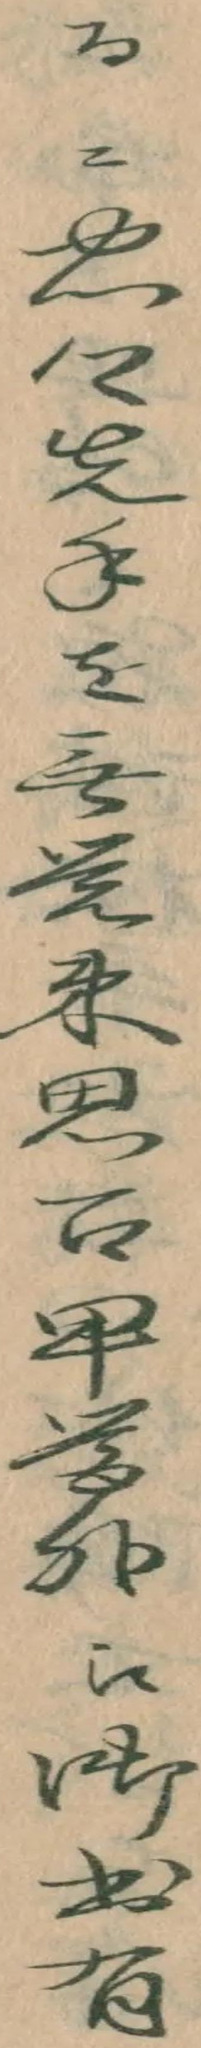るに忠郷先手を無覚束思召甲営外江御出有
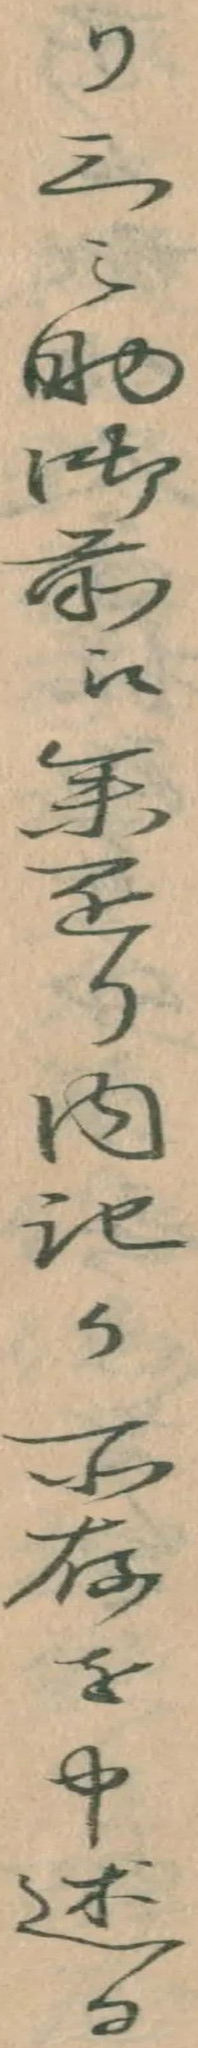り三之助御前江参懸り内記か所存を申述る
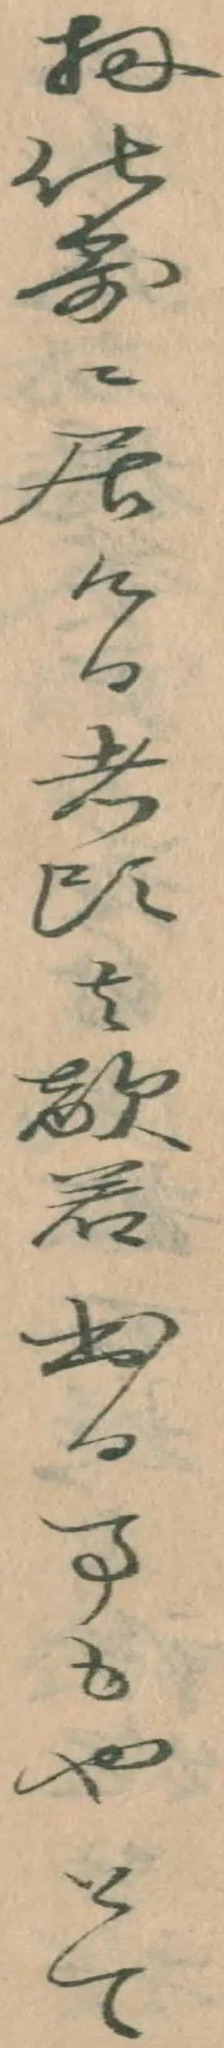扨仕寄に居ける者頭者敵若出る事もやとて

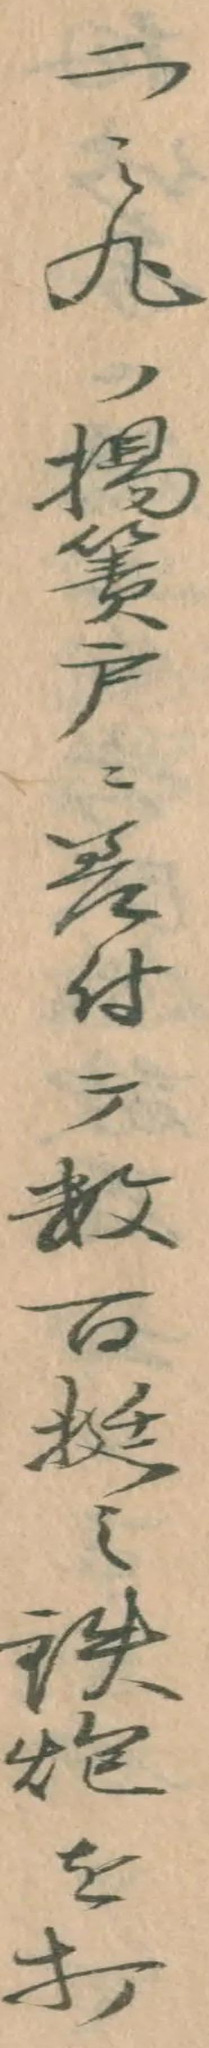二之丸之揚簀戸に差付て数百挺之鉄炮を打
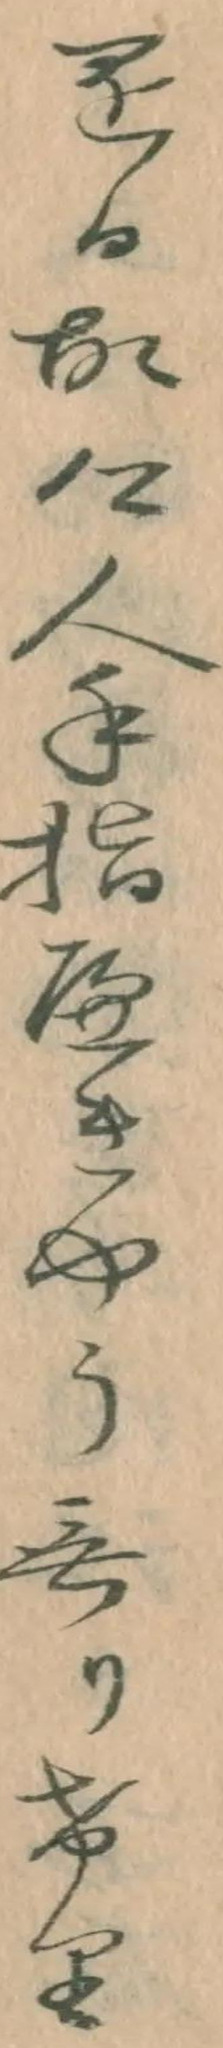懸る故郷人手指扁きゆう無り希里
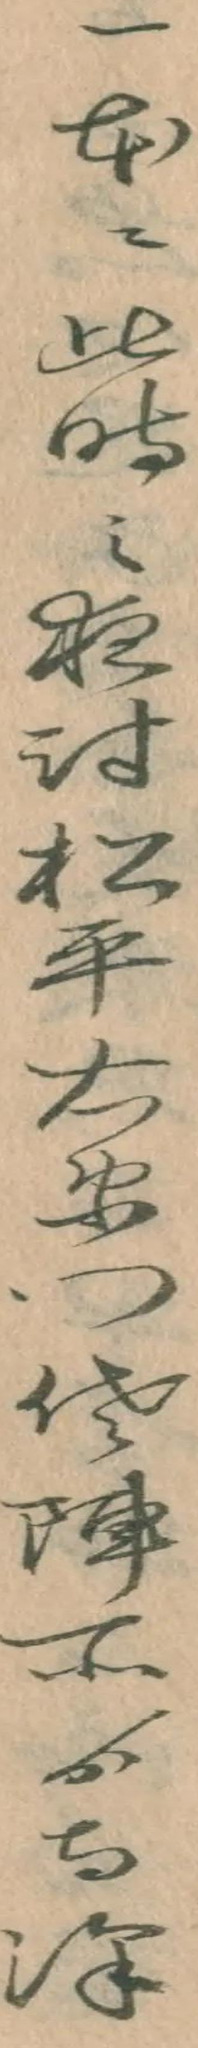一本に此時之夜討松平右衛門佐陣所ゟ寺沢
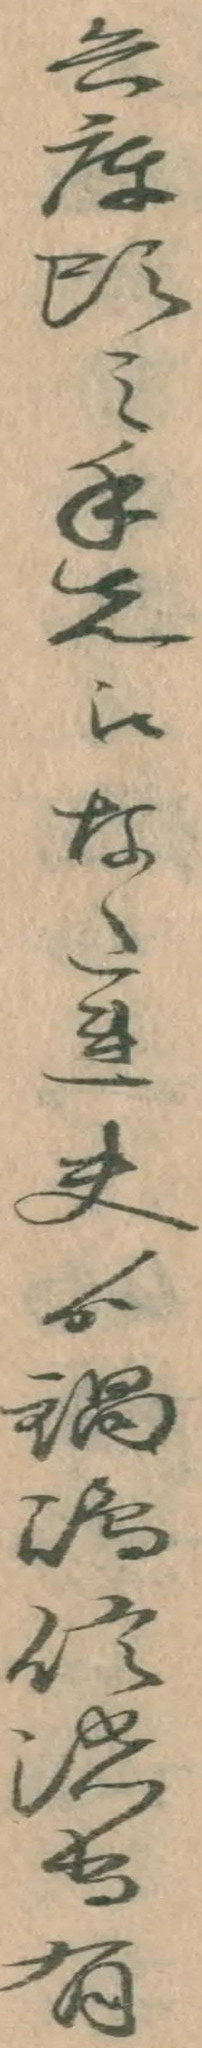兵庫頭之手先江なた連夫ゟ鍋島信濃守有
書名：切支丹御退治記 49巻. [7]
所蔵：国立国会図書館 National Diet Library, JAPAN
